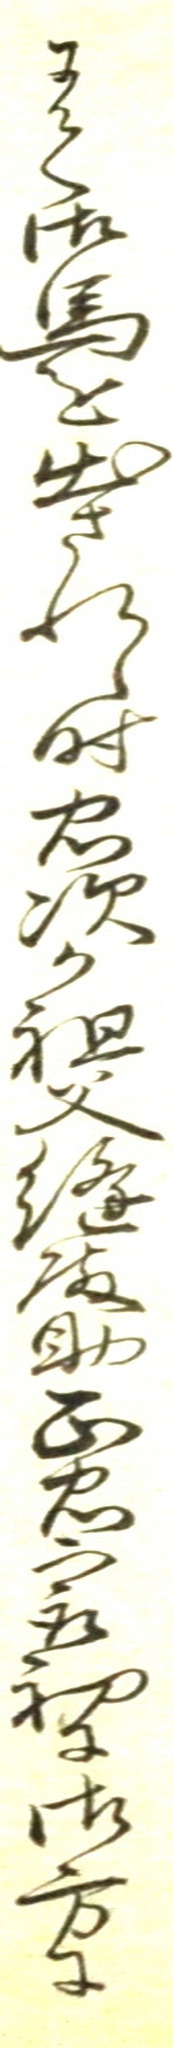にて御馬を出されし時忠次か祖父縫殿助正忠最初に御方に
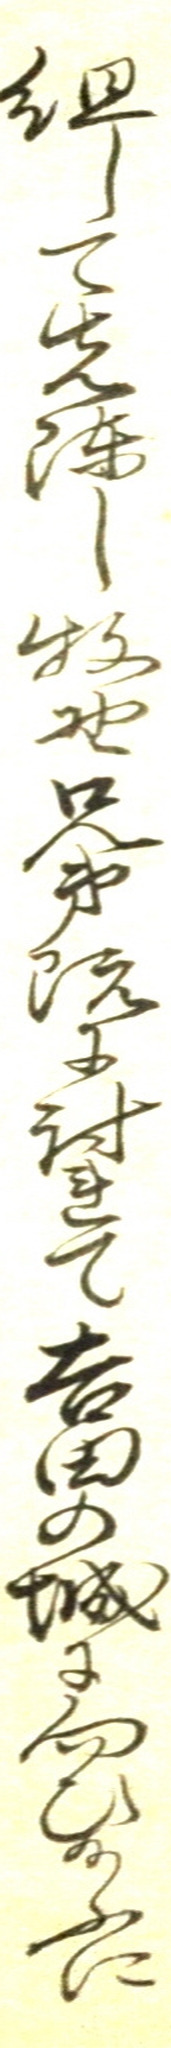組して先陣し牧野兄弟既に討れて吉田の城に向ひ給ふに
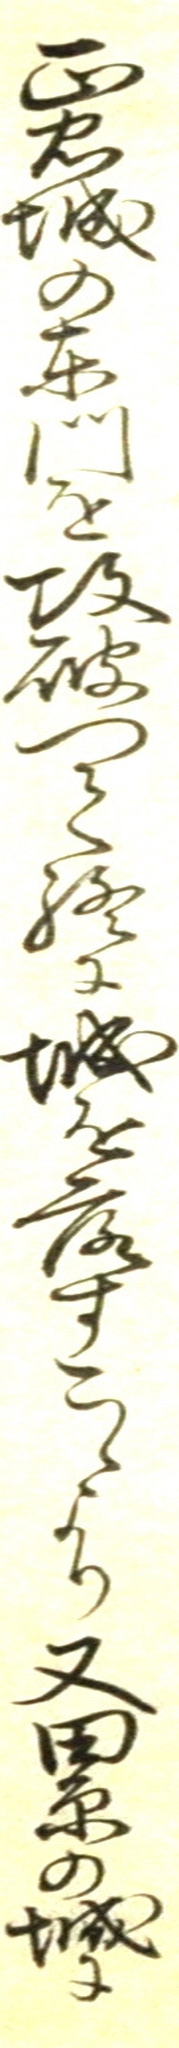正忠城の東門を攻破つて終に城を落すこゝより又田原の城に
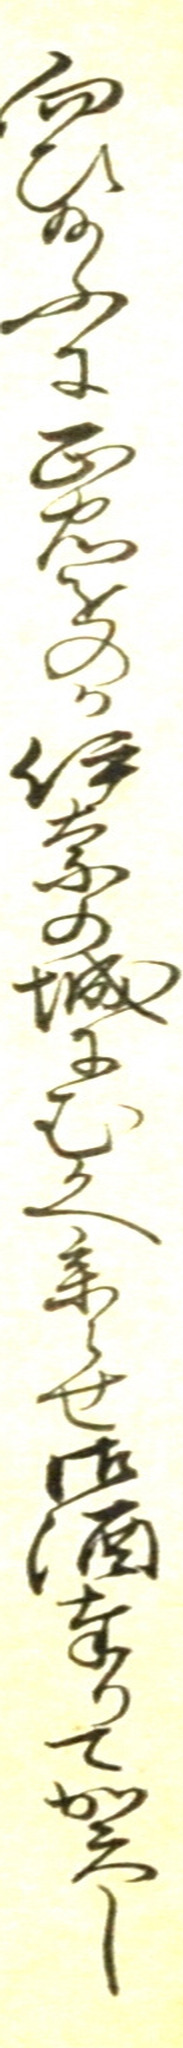向ひ給ふに正忠をのか伊奈の城にむかへ参らせ御酒奉りて賀し

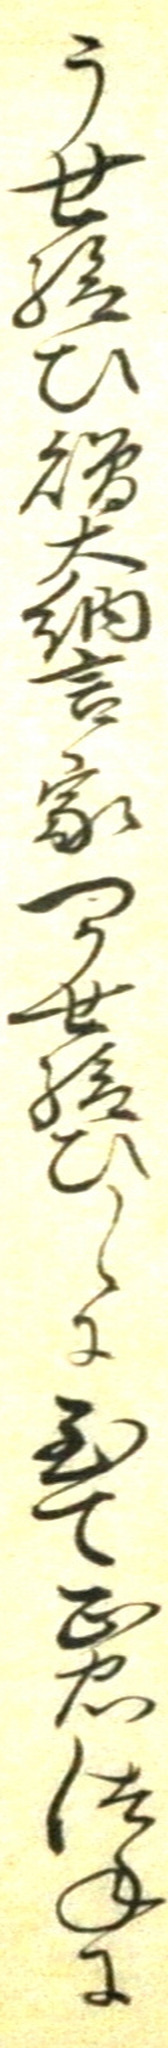うせ給ひ贈大納言家つかせ給ひしに至て正忠つねに
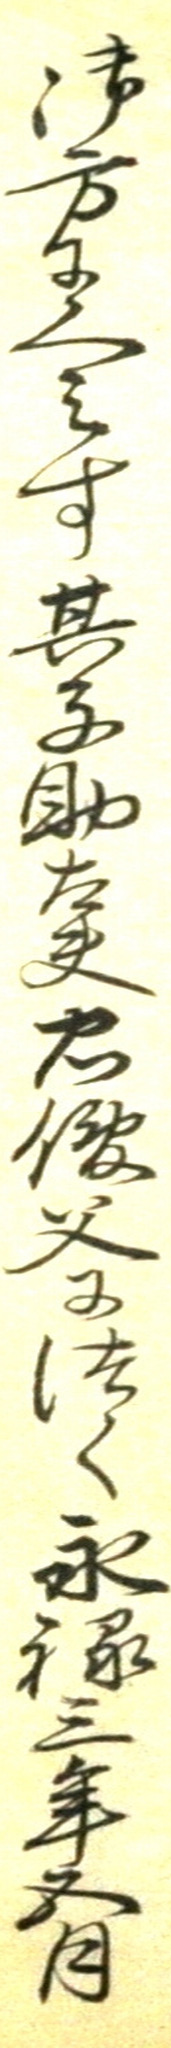御方にくみす其子助太夫忠俊父につく永禄三年五月
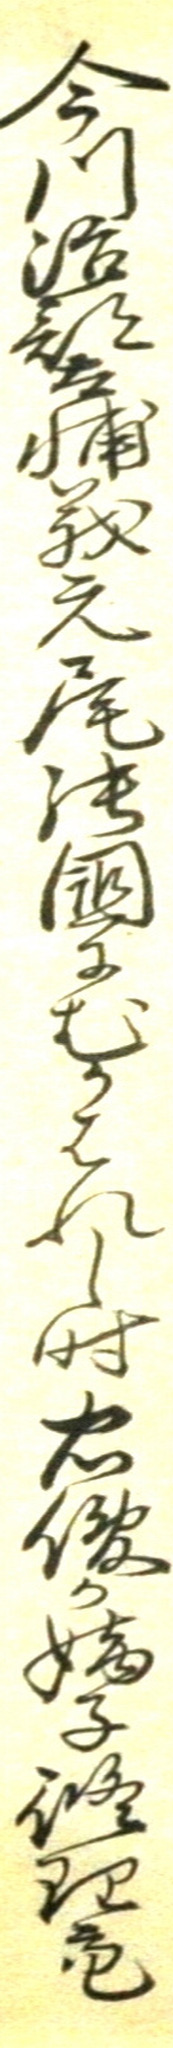今川治部太輔義元尾張国にむかはれし時忠俊か嫡子修理亮
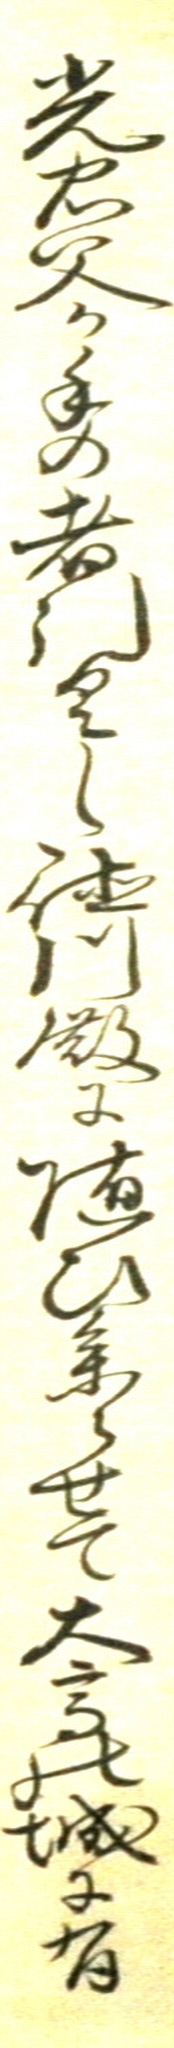光忠父か手の者引具し徳川殿に随ひ参らせて大高の城に有
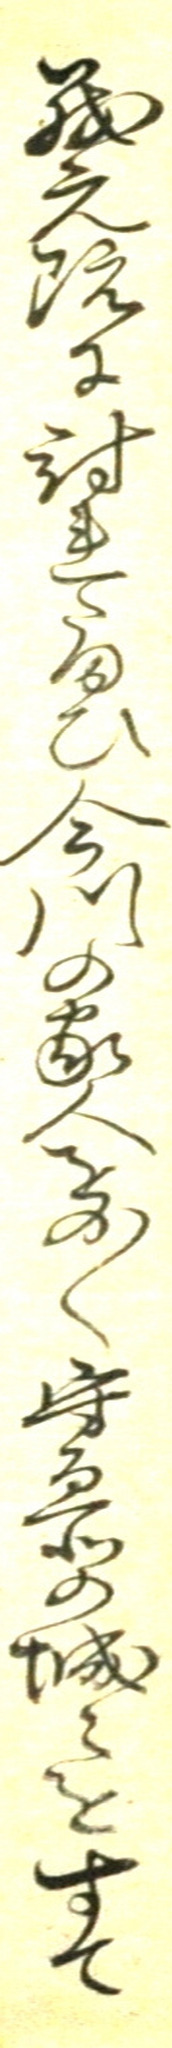義元既に討れたまひ今川の家人をの〳〵守る所の城々をすて
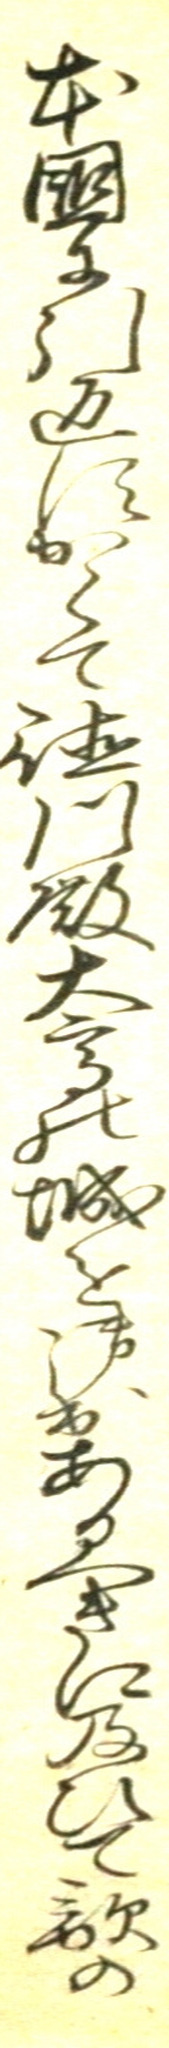本国に引返すかくて徳川殿大高の城を御出あるへきに及ひて敵の
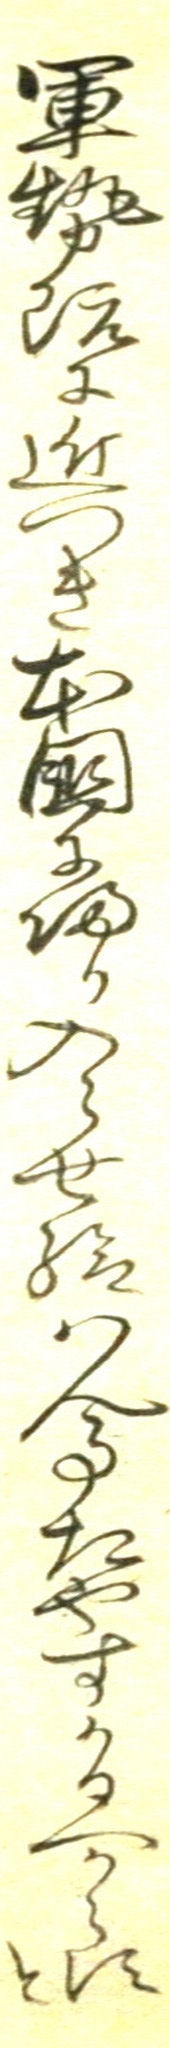軍勢既に近つき本国に帰り入らせ給はん事たやすかるへからすと
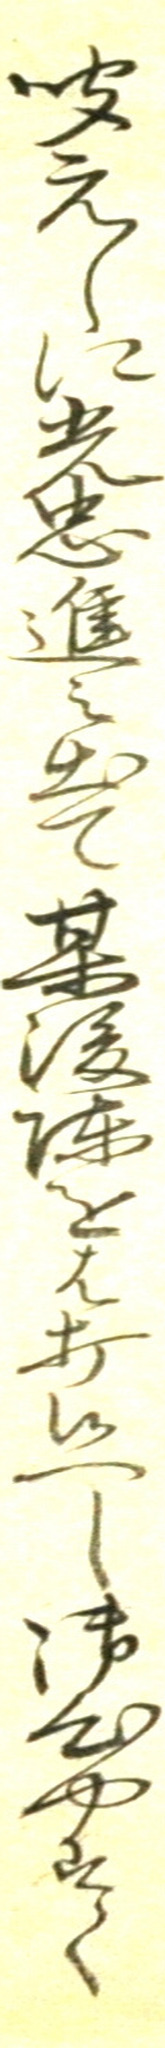聞えしに光忠進み出て某後陣をは打候へし御心やすく
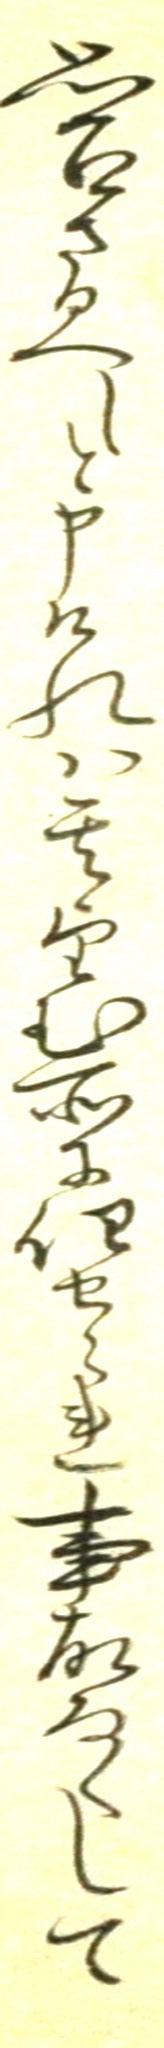思召さるへしと申けれは其望む所に任せられ事故なくして
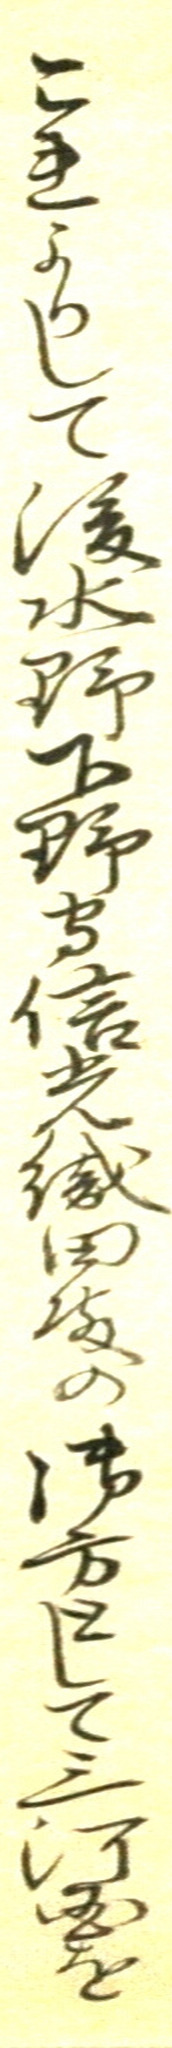これよりして後水野下野守信光織田殿の御方として三河国を
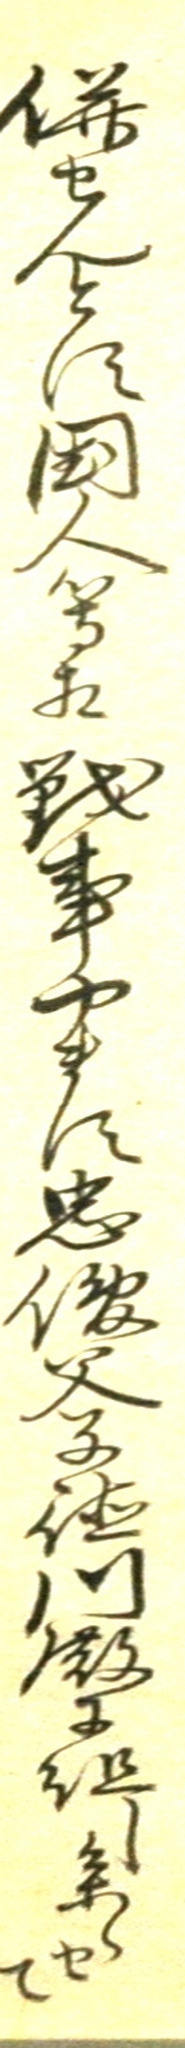併せんとす国人等相戦事やます忠俊父子徳川殿に組し参らせて

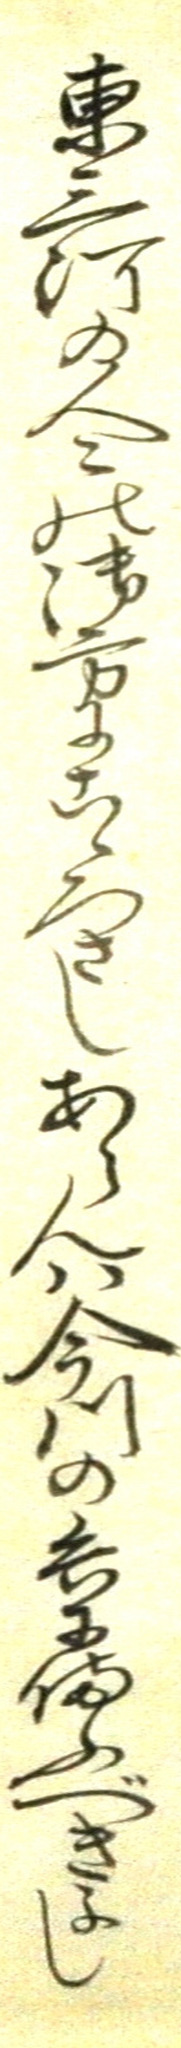東三河の人々の御方にこゝろさしあらんは今川の兵に備ふべきよし
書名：藩翰譜（四・上）
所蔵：伊那市立高遠町図書館・合同会社AMANE
